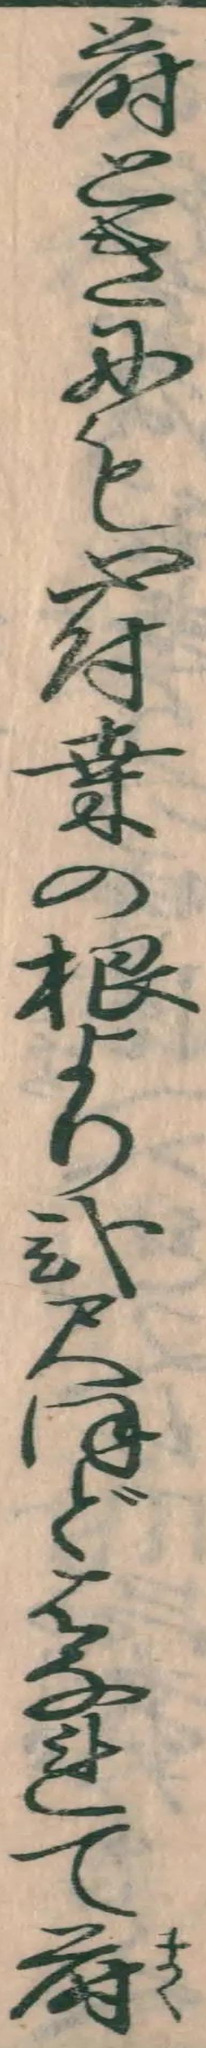蒔ときにも心付桑の根より弐尺ほどはなれて蒔
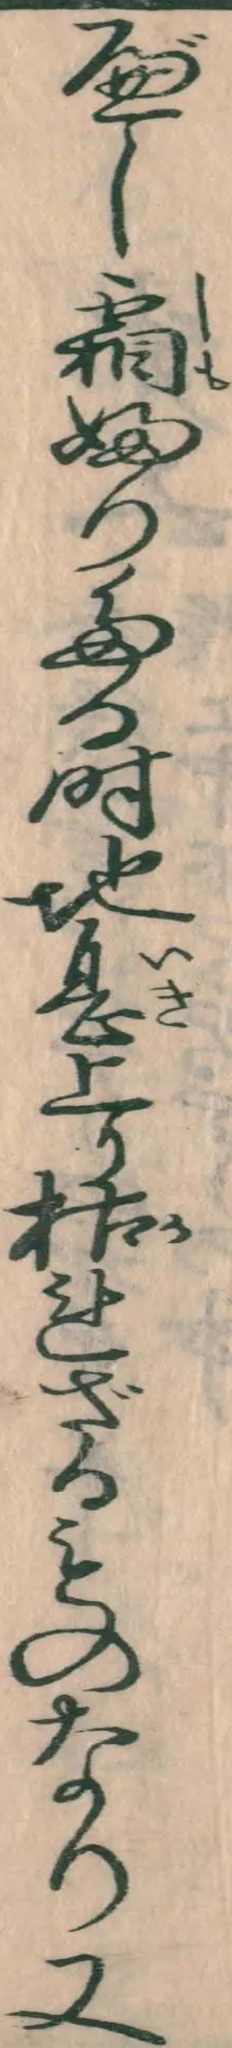べし霜ふりたる時地息上り枯れざるものなり又
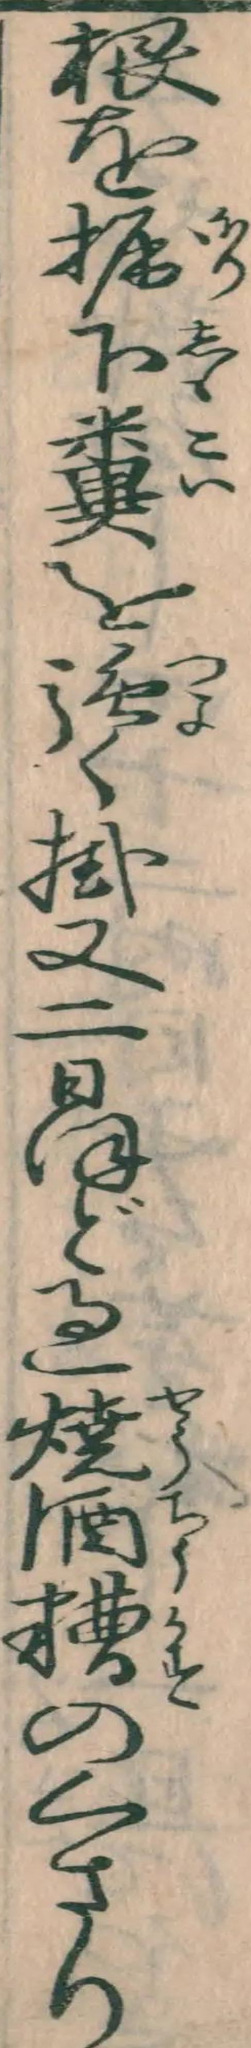根を掘下糞を強く掛又二日ほど過焼酒糟のくさり

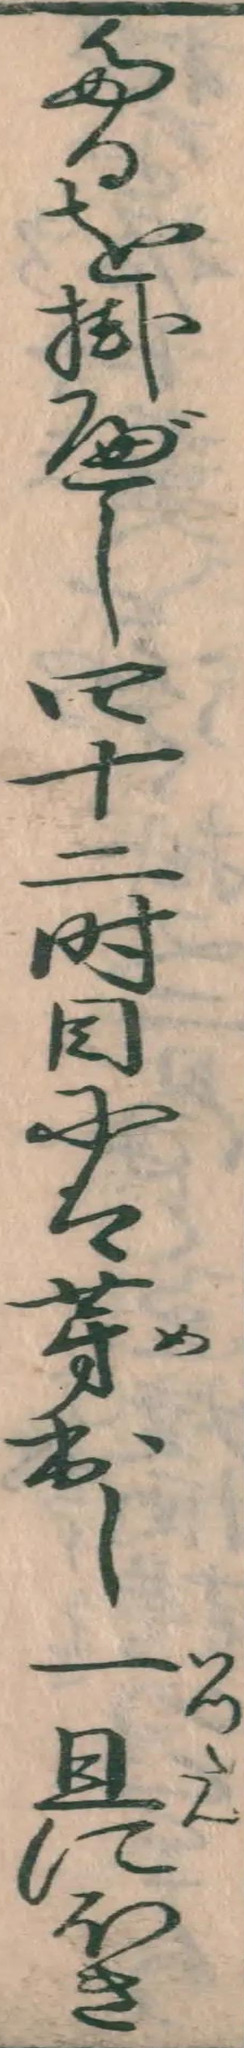たるを掛べし四十二時目には芽出し一旦にほき
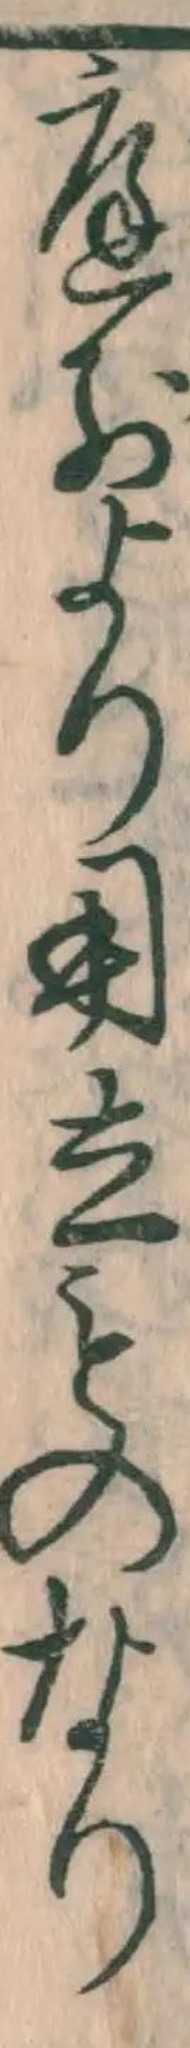庭前より用立ものなり
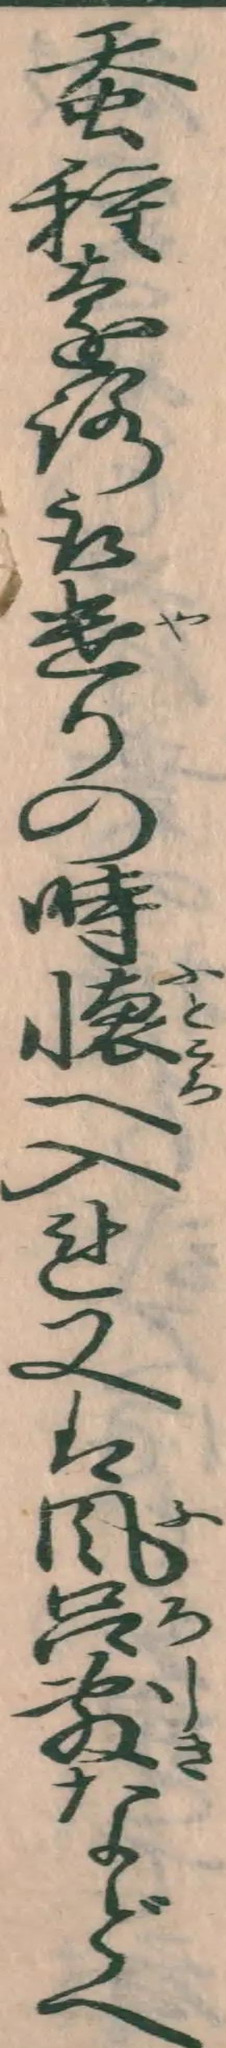蚕種遠路取遣りの時懐へ入れ又は風呂敷などへ
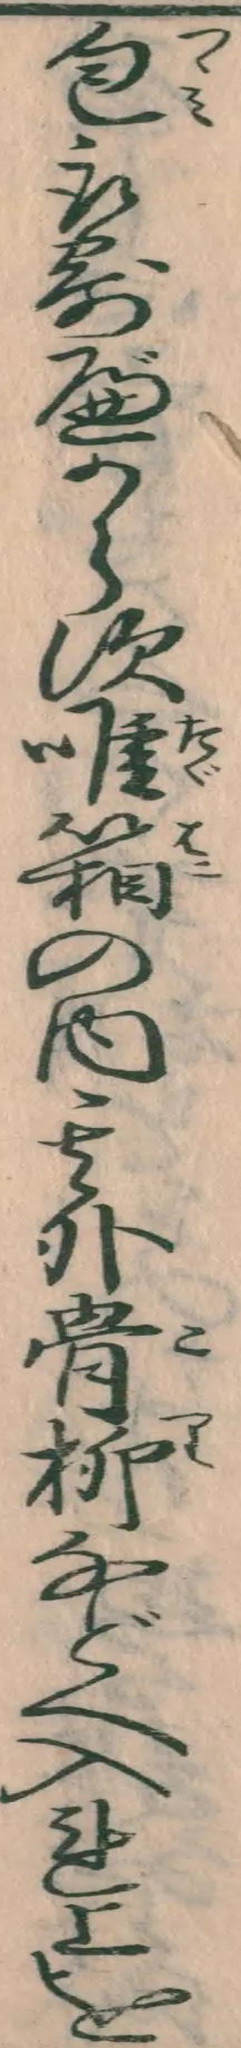包取寄べからす唯箱の内其外骨柳などへ入れ上を
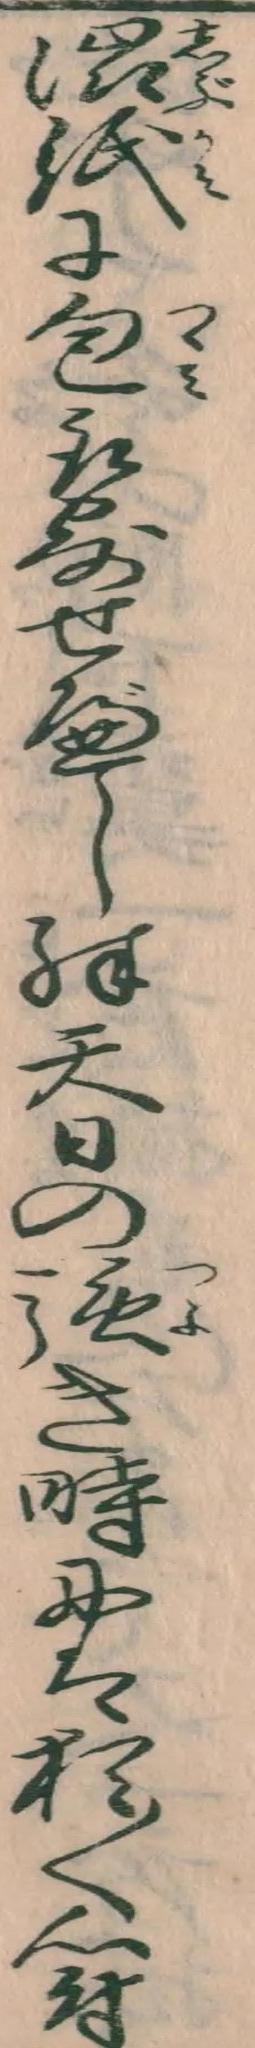渋紙に包取寄せべし殊天日の強き時には猶〳〵心付
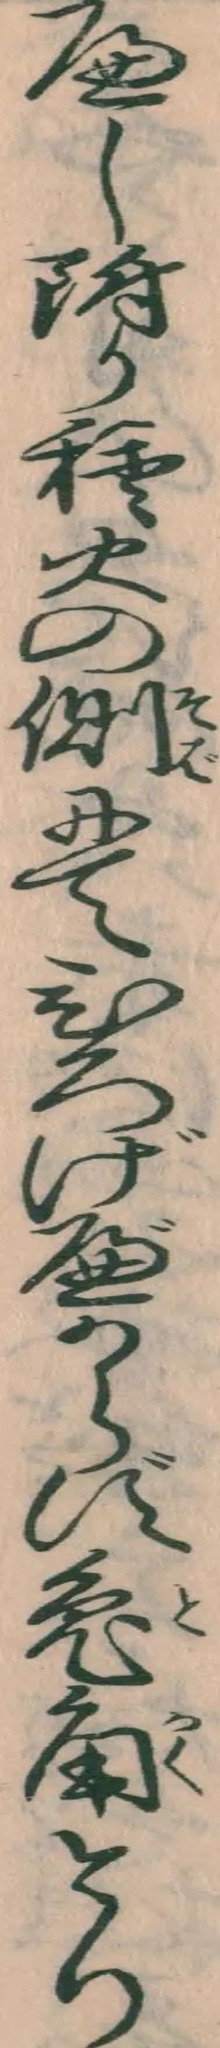へし附り種火の側にてひろげべからず兎角とり
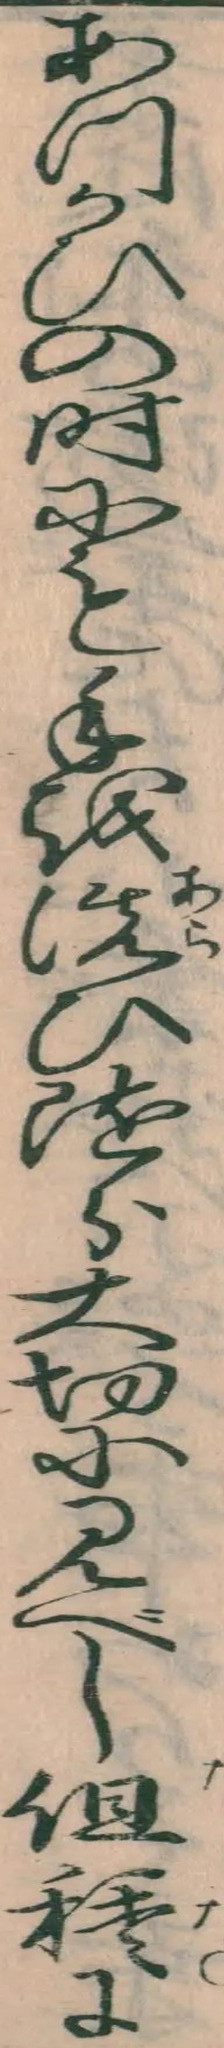あつかひの時にも手を洗ひ随分大切に見べし但種に
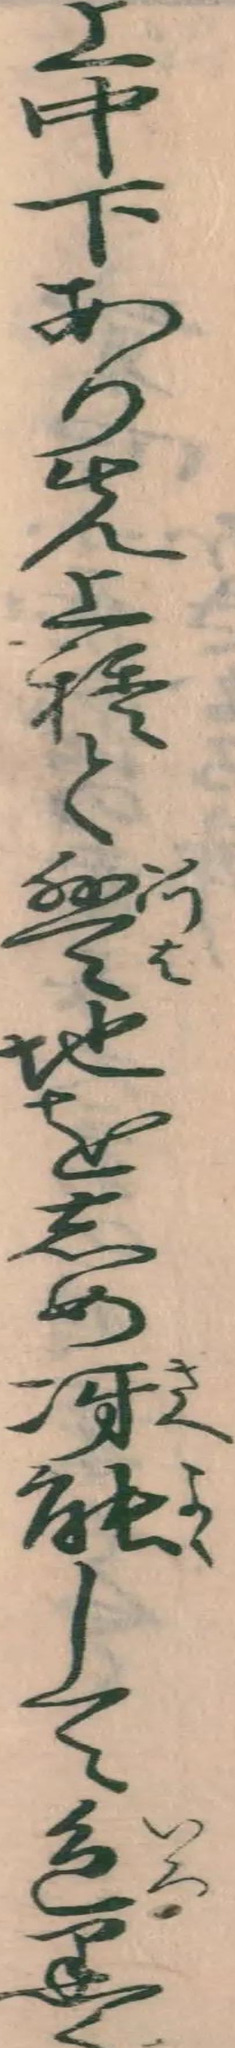上中下あり先上種とは地をしめ冴能して色黒く
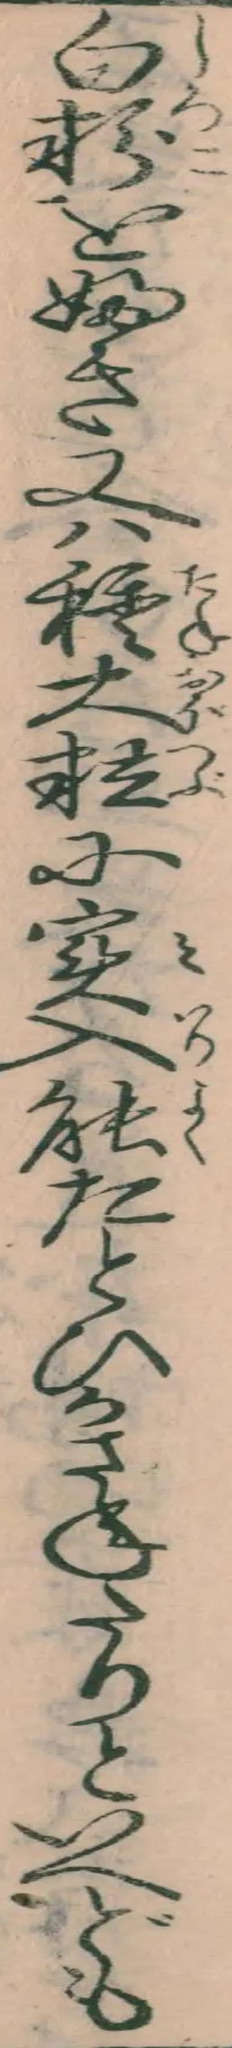白粉をふき又は種大粒に実入能たとひかさねたりといへども
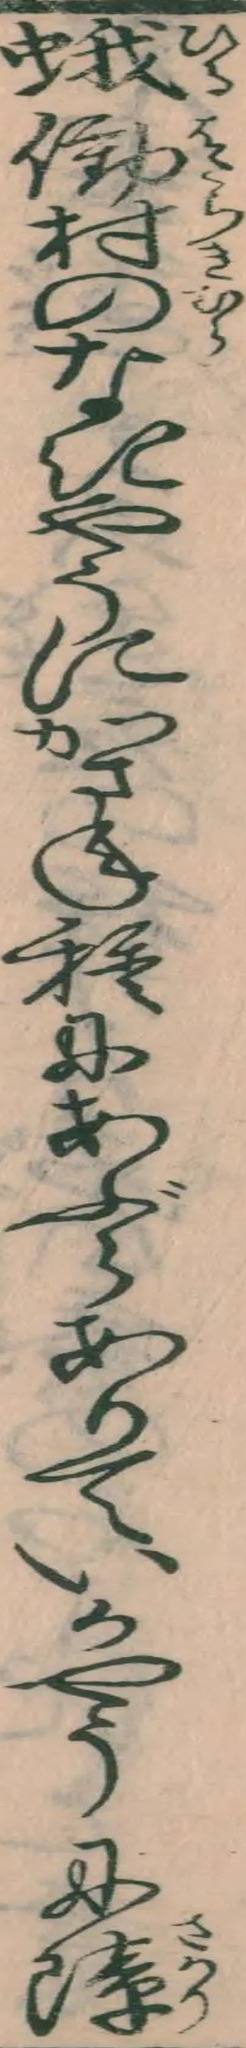蛾働村のなきやうにかさね種にあぶらありていかやうに障
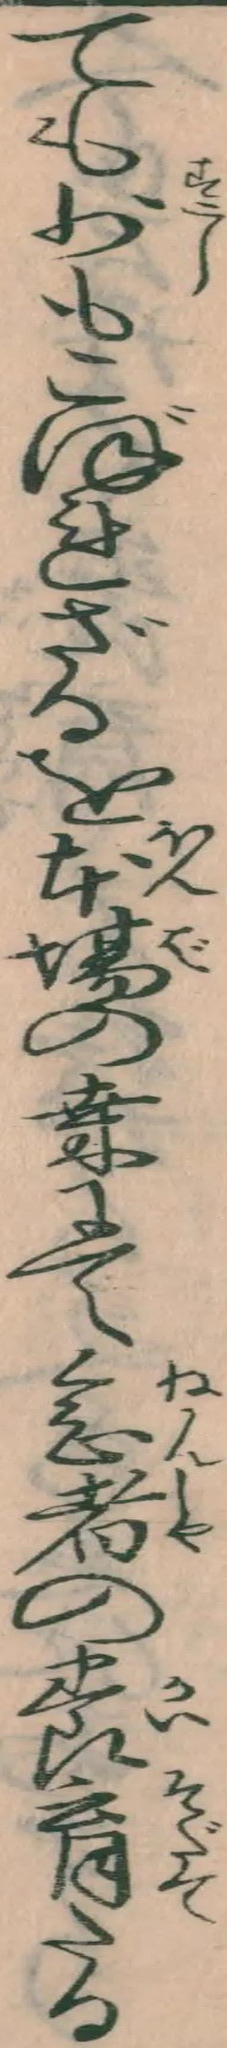ても少もこぼれざるを本場の桑にて念者の養育たる
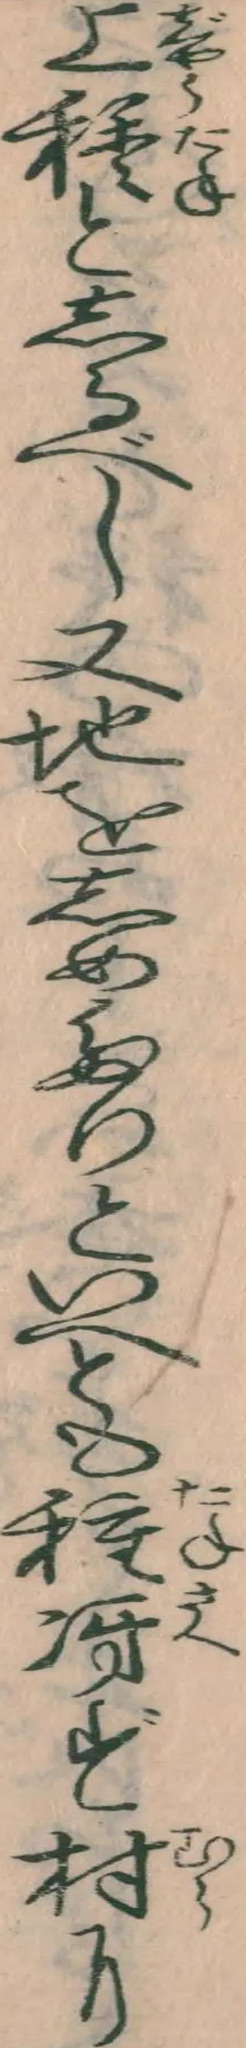上種としるべし又地をしめたりといへとも種冴ず村に
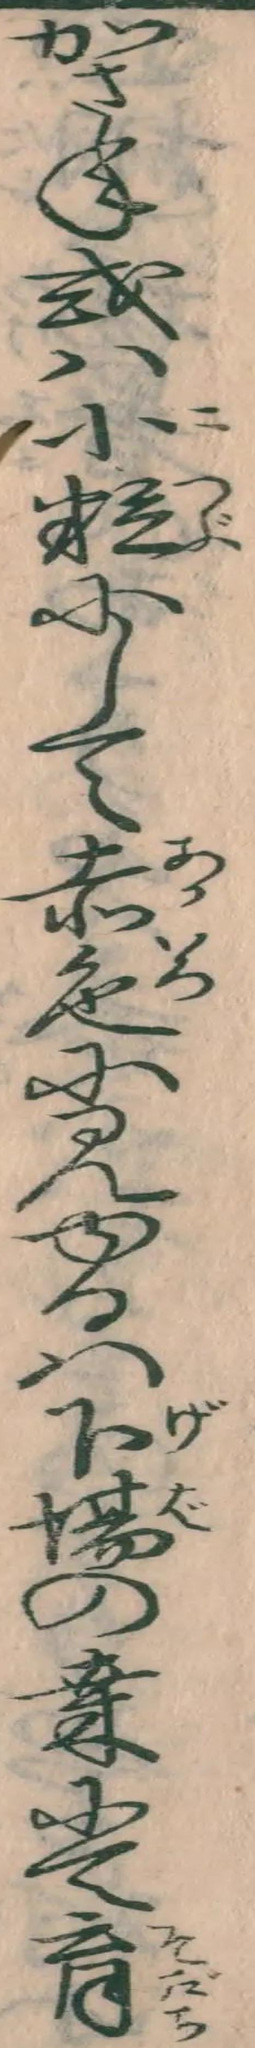かさね或は小粒にして赤色に見ゆるは下場の桑にて育
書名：新撰養蚕秘書
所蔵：国立国会図書館 National Diet Library, JAPAN
